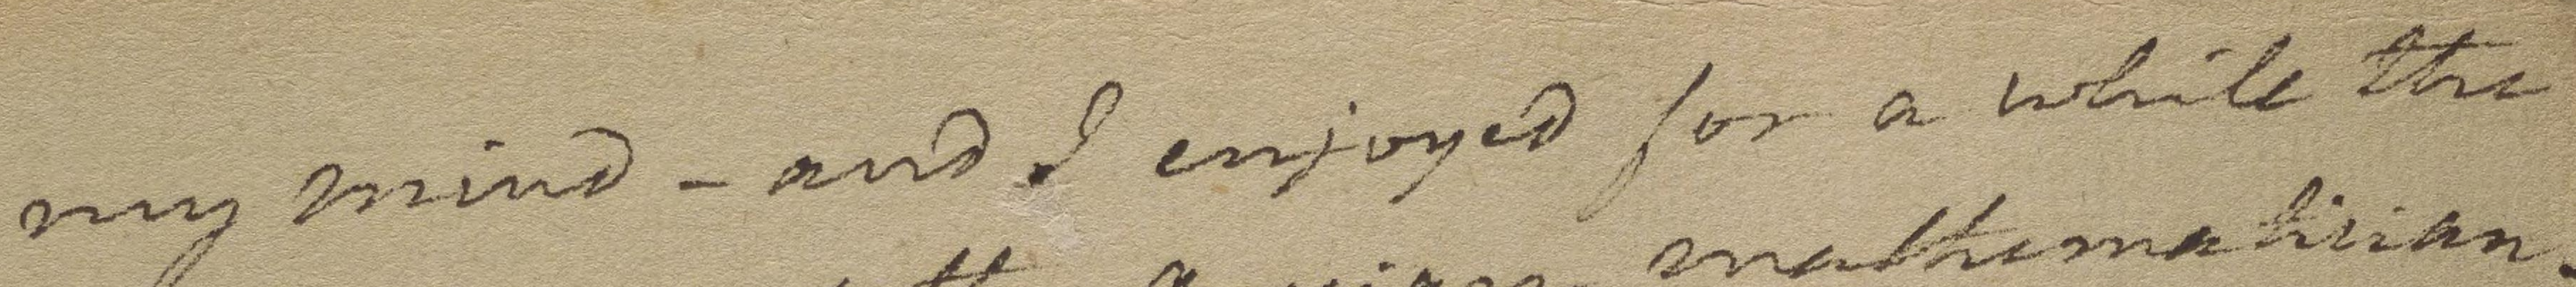my mind, and I enjoyed for a while the
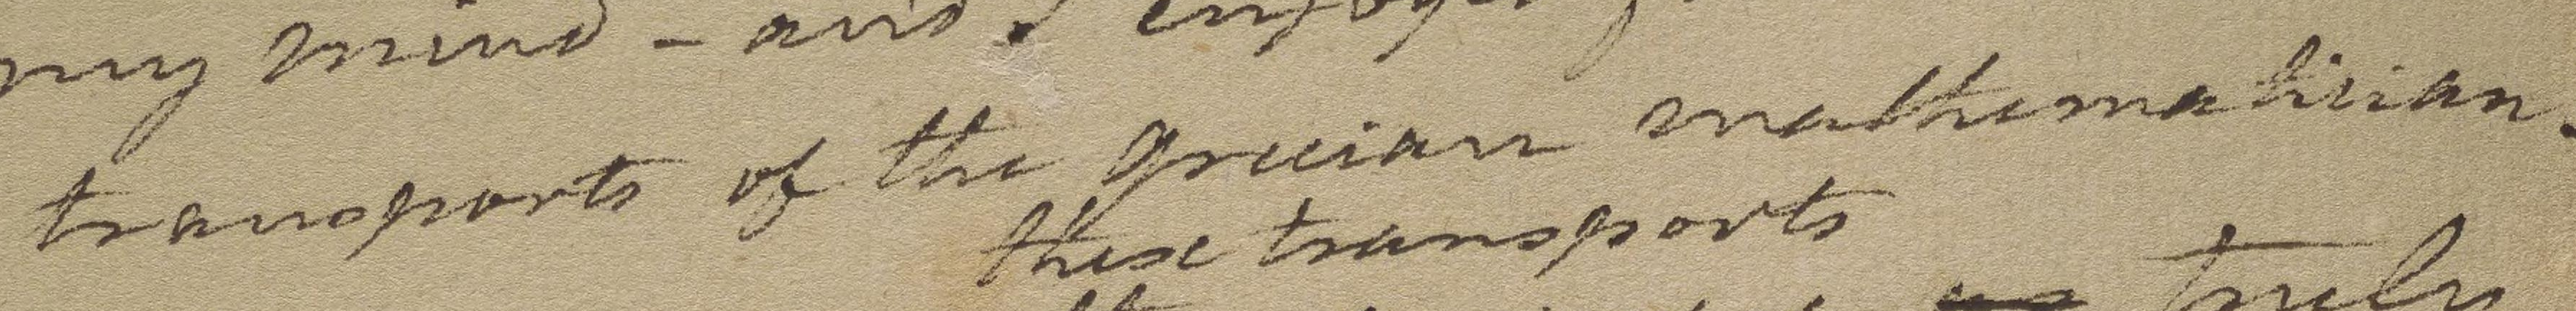transports of the grecian mathematician-
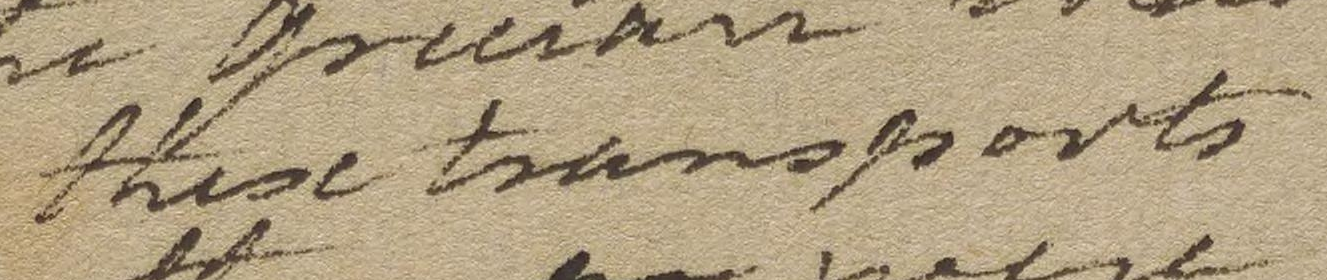these transports
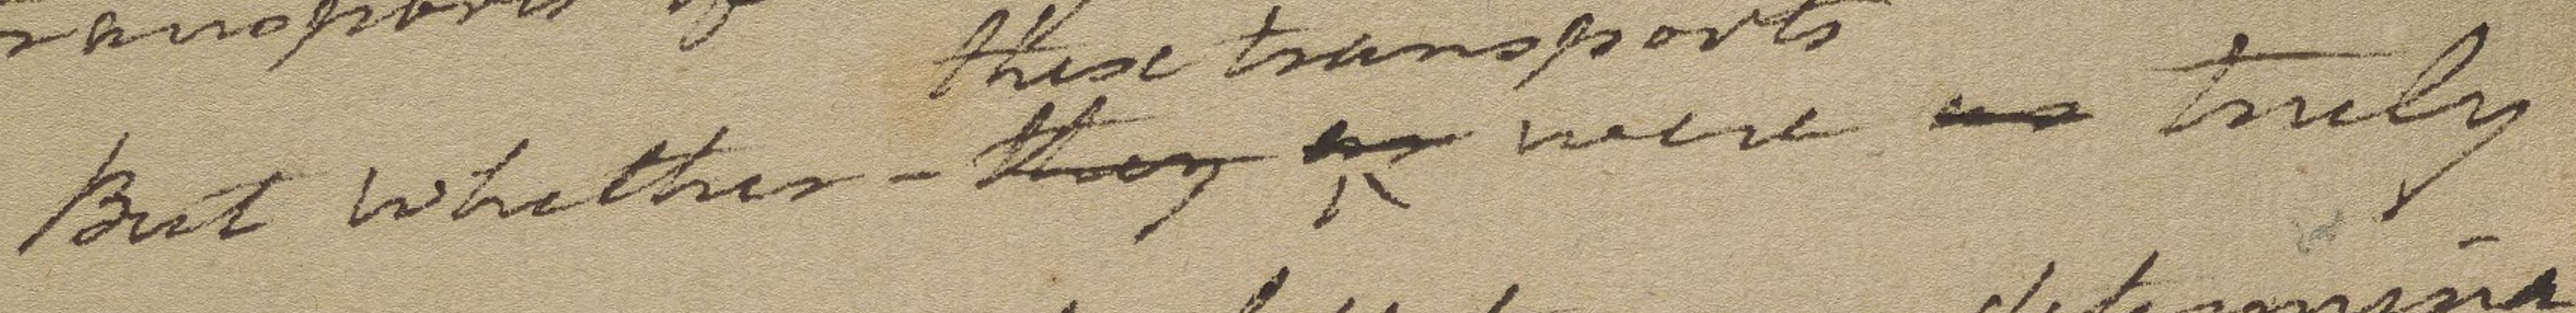But whether- [they] [__] ^ were [as] truly
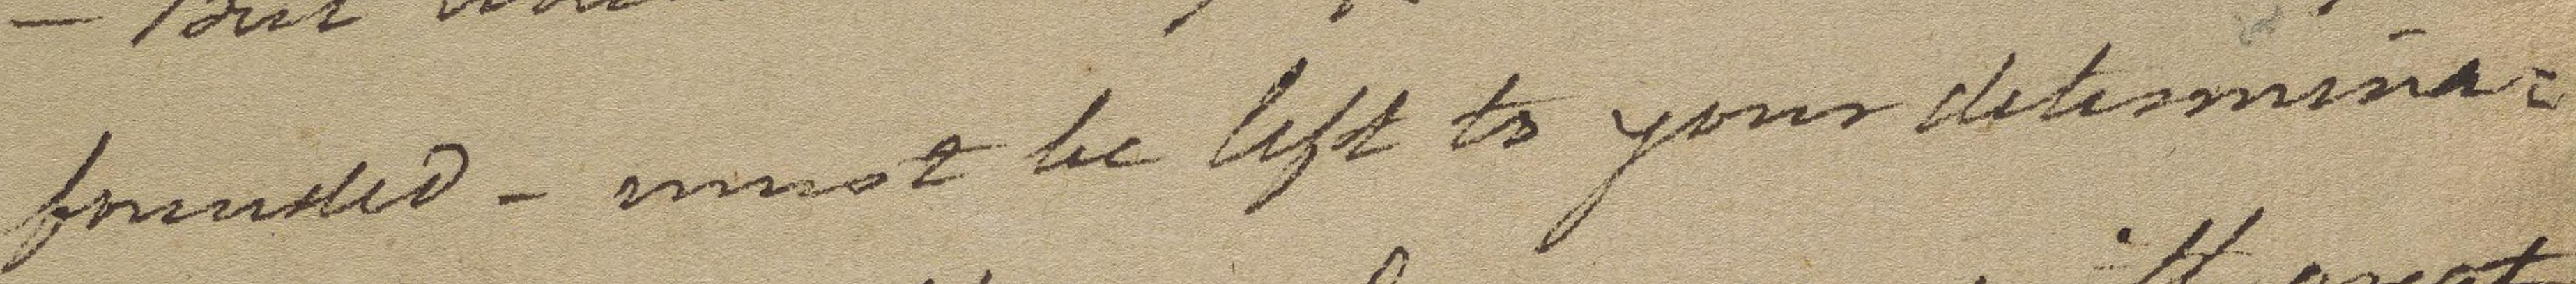founded- must be left to your determina-
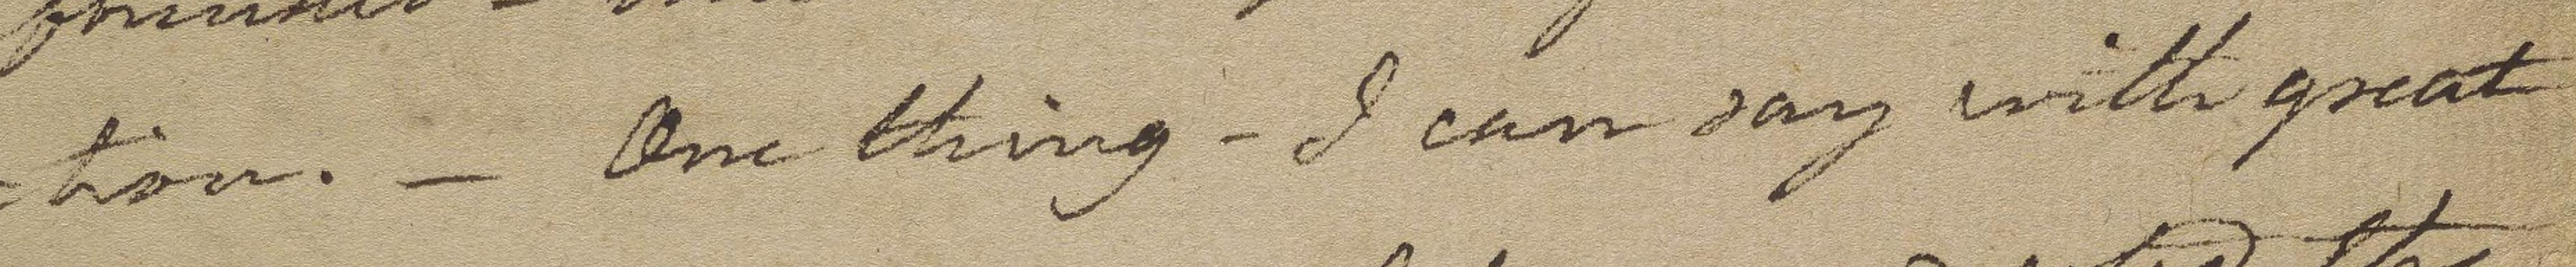-tion.- One thing- I can say with great
